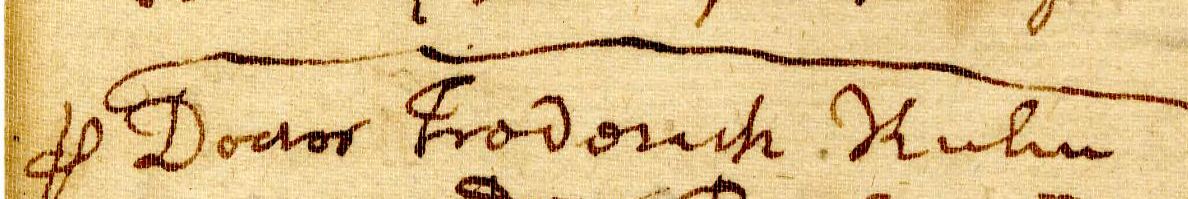per Doctor Frederick Kuhn
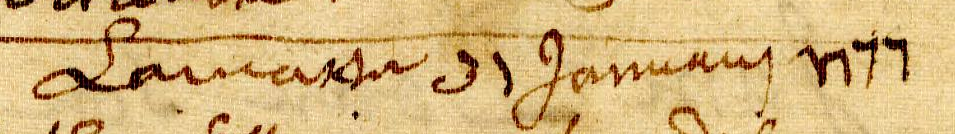Lancaster 31 January 1777
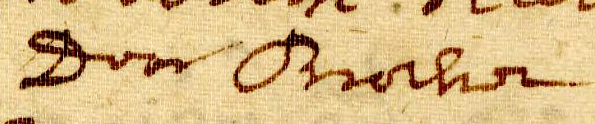Dear Brother
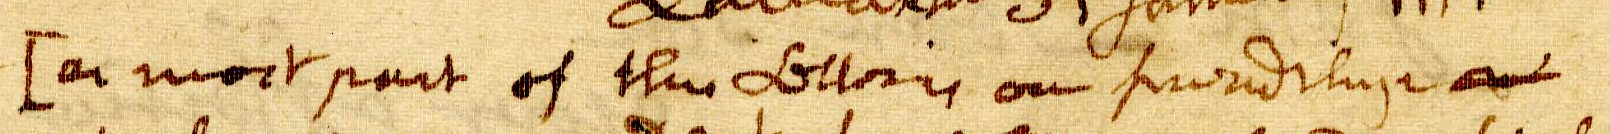)as most part of this Letter is on funding a
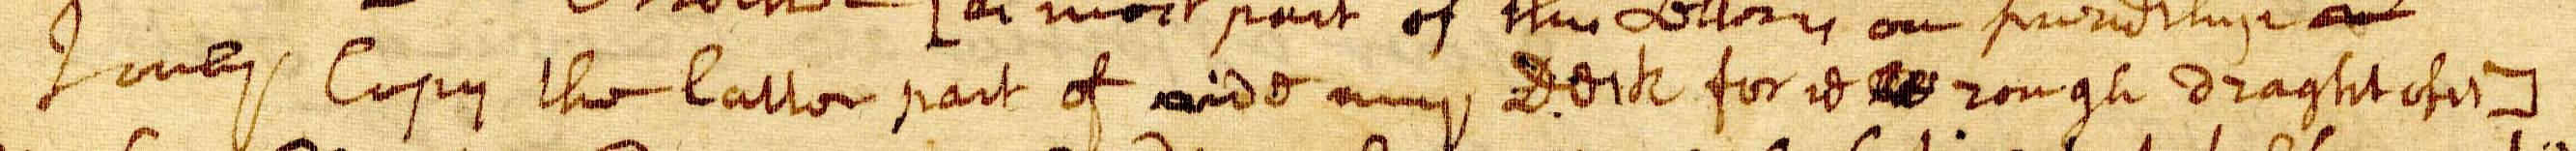I only Copy the latter part of vide my Desk for y^e [___] rough draght of it)
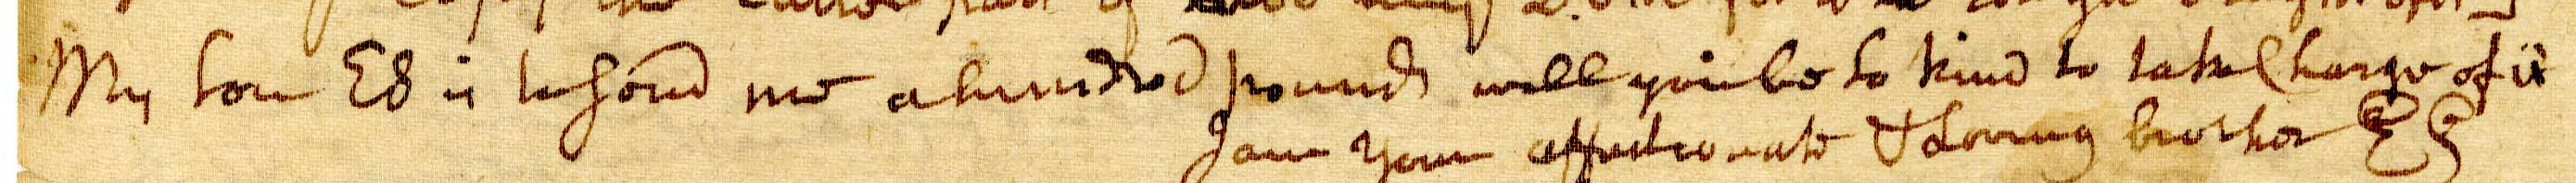My Son ES is to send me a hundred pounds will you be to kind to take Charge of it
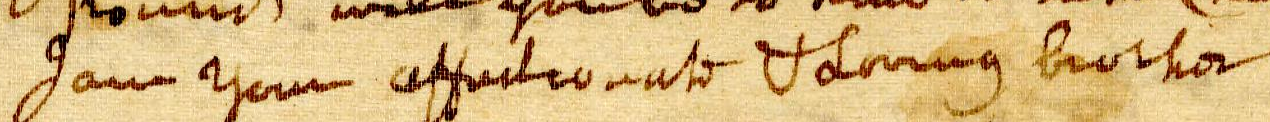I am Your affectionate & Loving brother
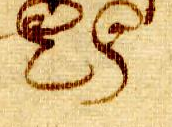ES
